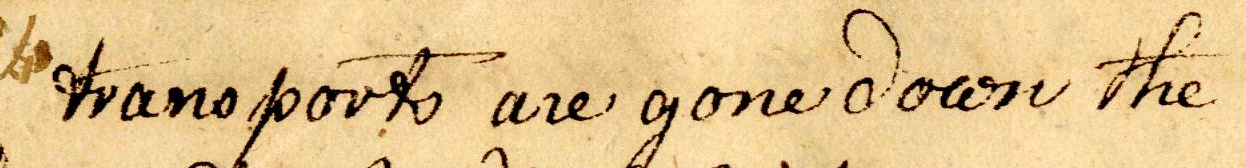transports are gone down the
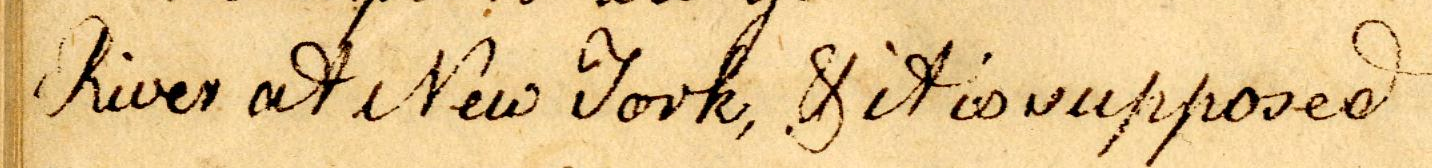River at New York, & it is supposed
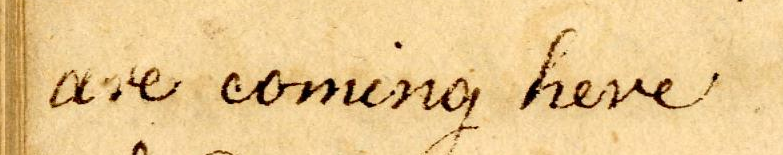are coming here-
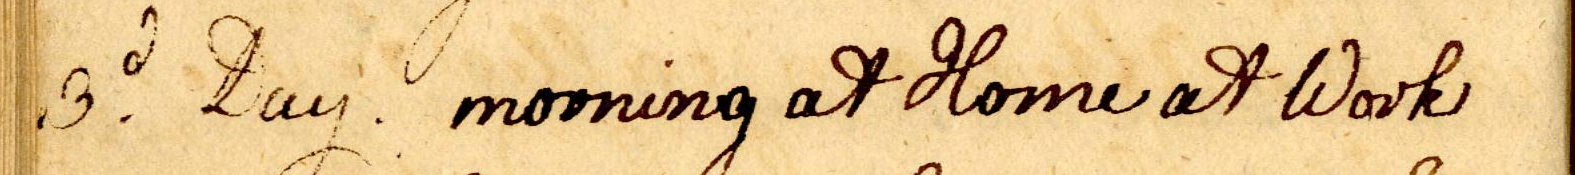3^d. Day. morning at Home at Work
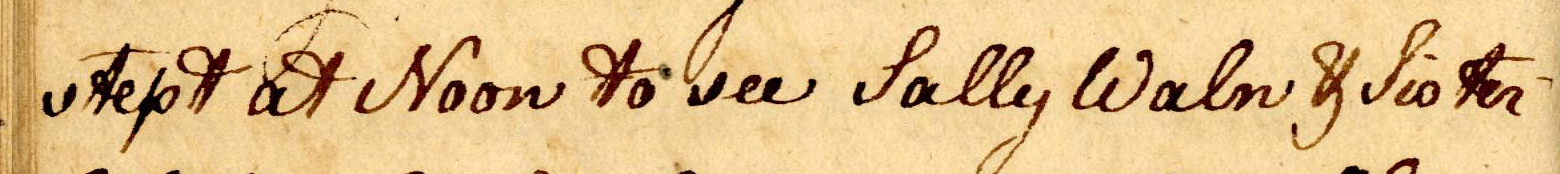stept at Noon to see Sally Waln & Sister
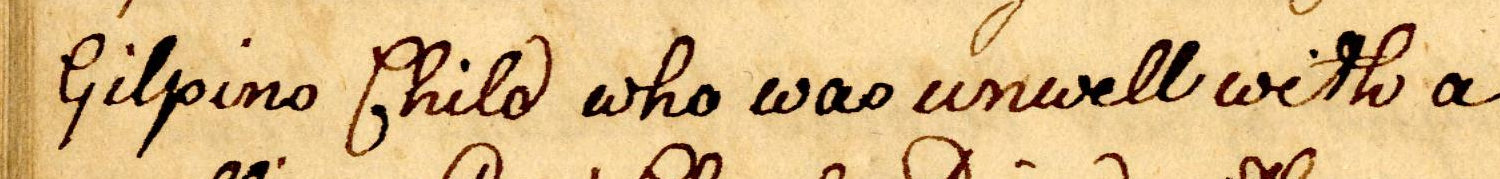Gilpins Child who was unwell with a
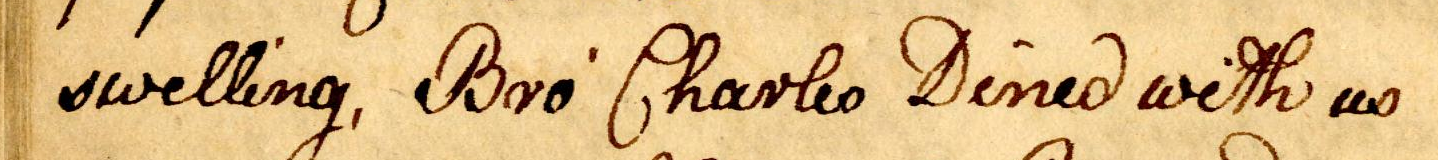swelling, Bro' Charles Dined with us
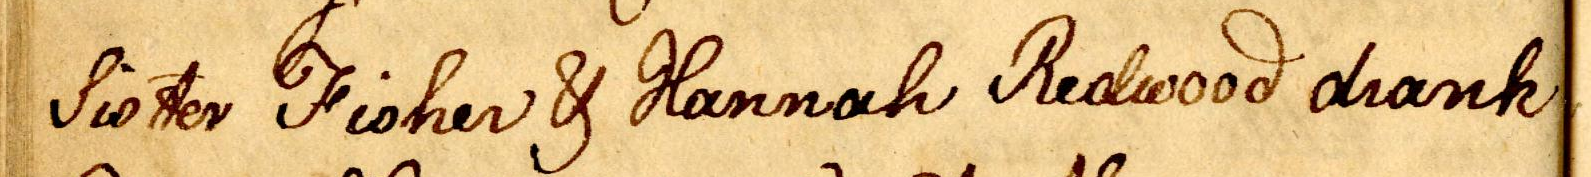Sister Fisher & Hannah Redwood drank
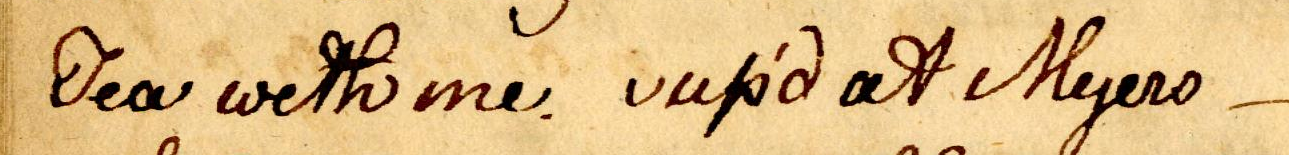Tea with me. sup'd at Myers -
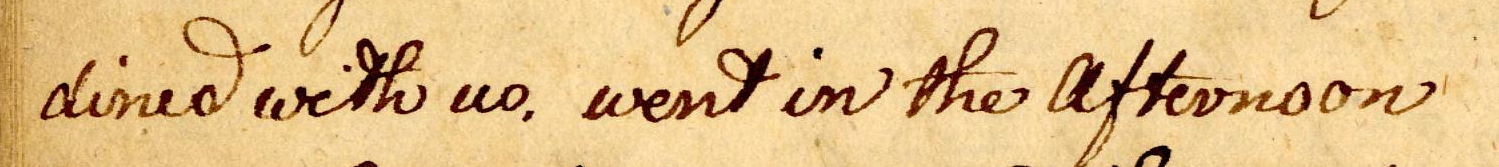dined with us. went in the Afternoon
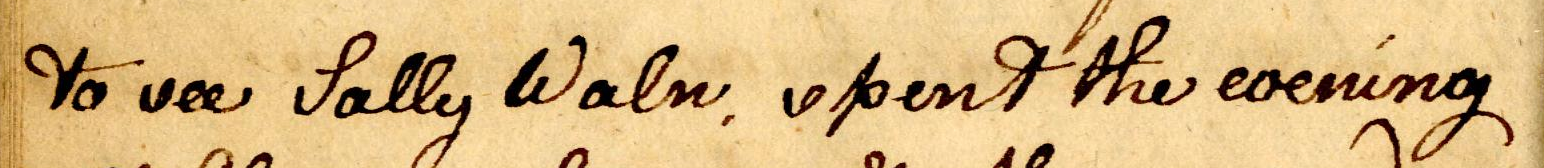to see Sally Waln, spent the evening
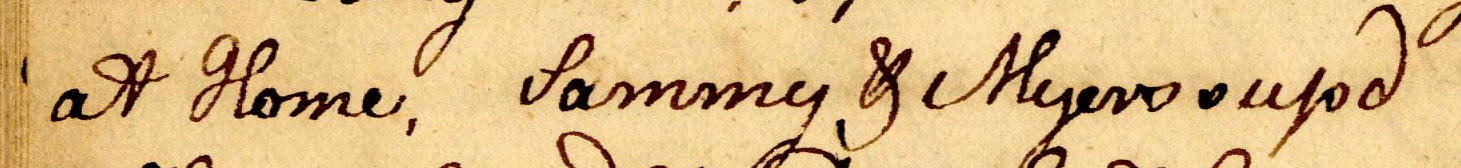at Home, Sammy & Myers supd
